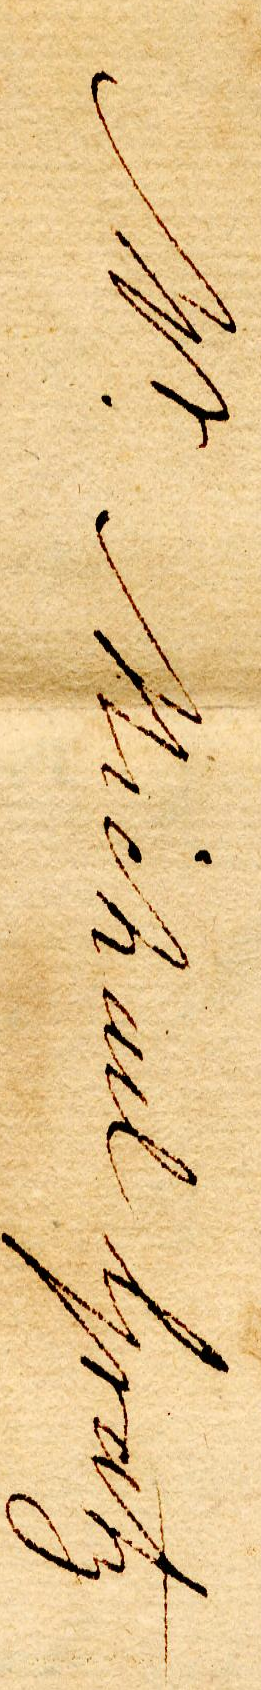M^r Michael Gratz
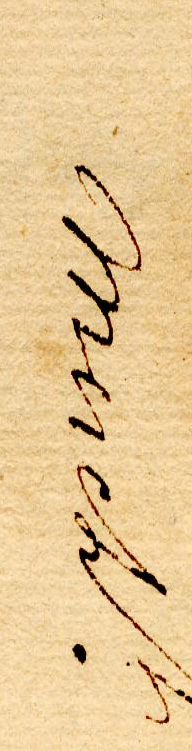Merch^t
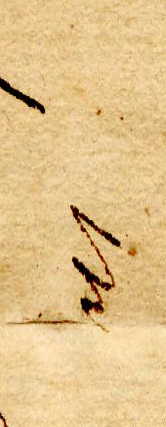in
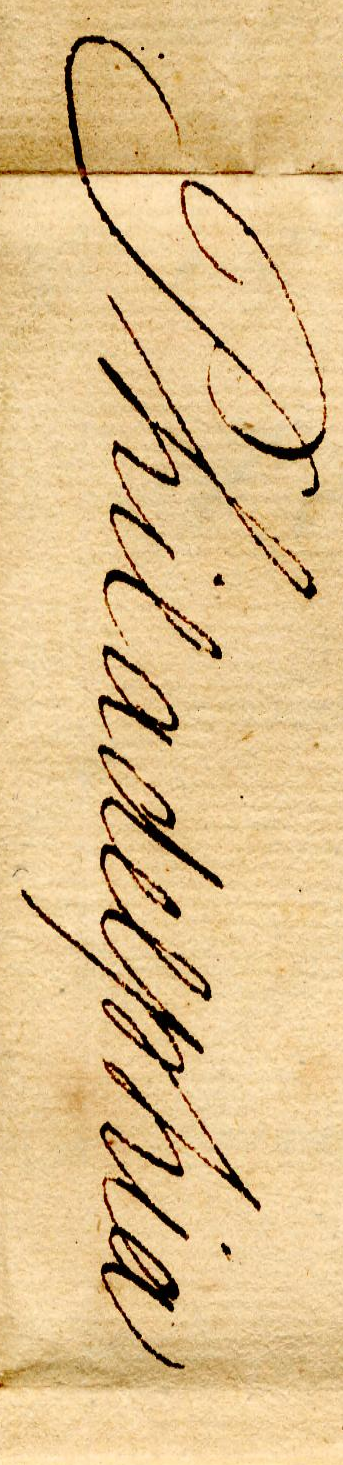Philadelphia
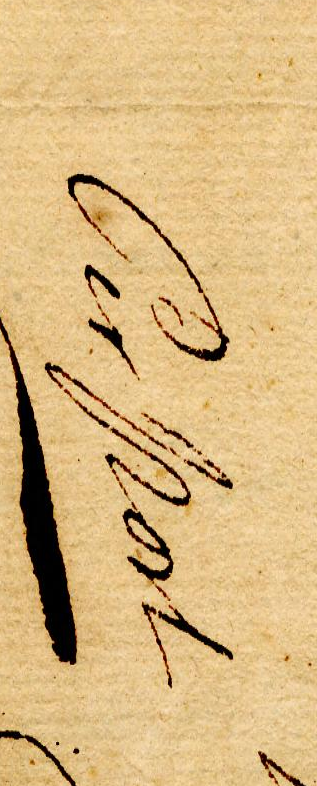Per post
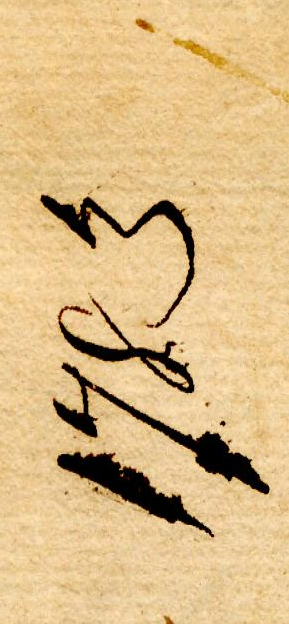1783
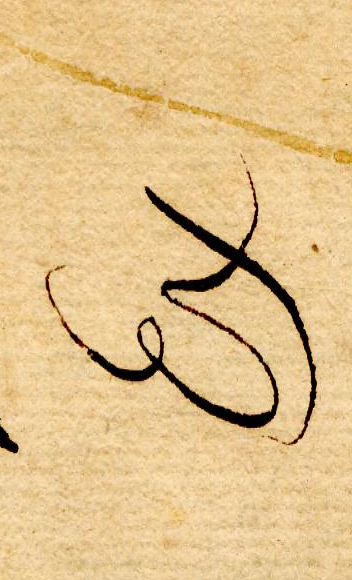Ex
